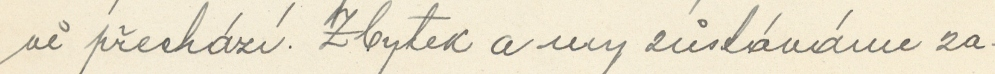vě přechází. Zbytek a my zůstáváme za-
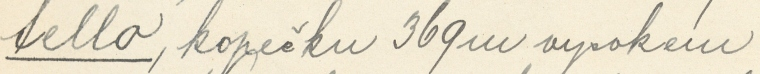tello, kopečku 369 m vysokém.
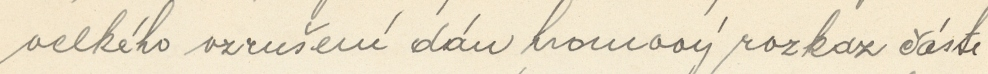velkého vzrušení dán hromový rozkaz části
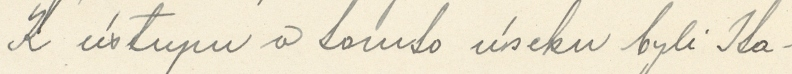K ústupu v tomto úseku byli Ita-
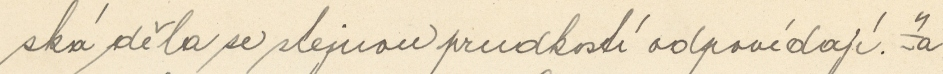ská děla se stejnou prudkostí odpovídají. Za
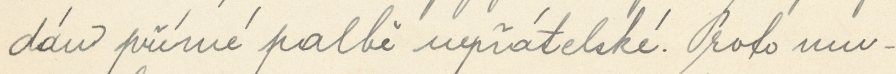dán přímé palbě nepřátelské. Proto mu-
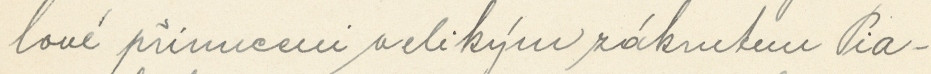lové přinuceni velikým zákrutem Pia-
